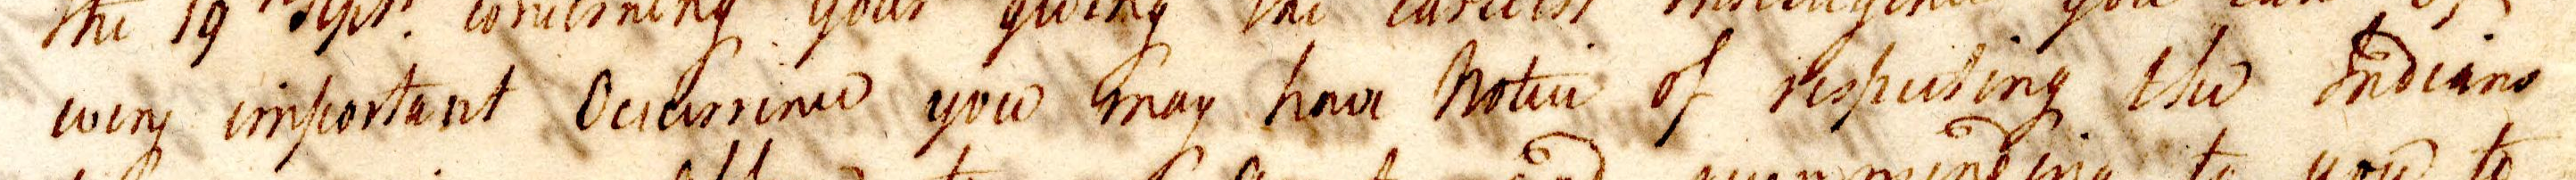every important Occurrence you may have notice of respecting the Indians
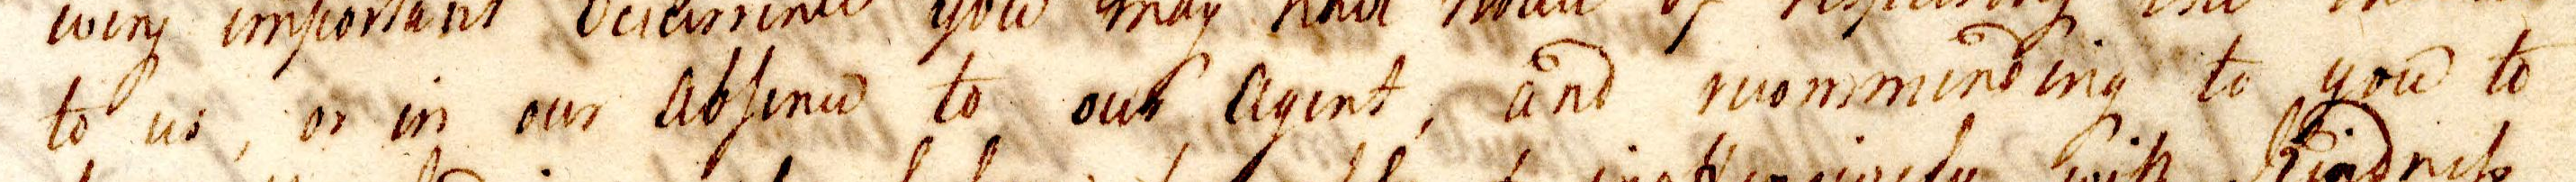to us or in our absence to our agent, and recommending to you to
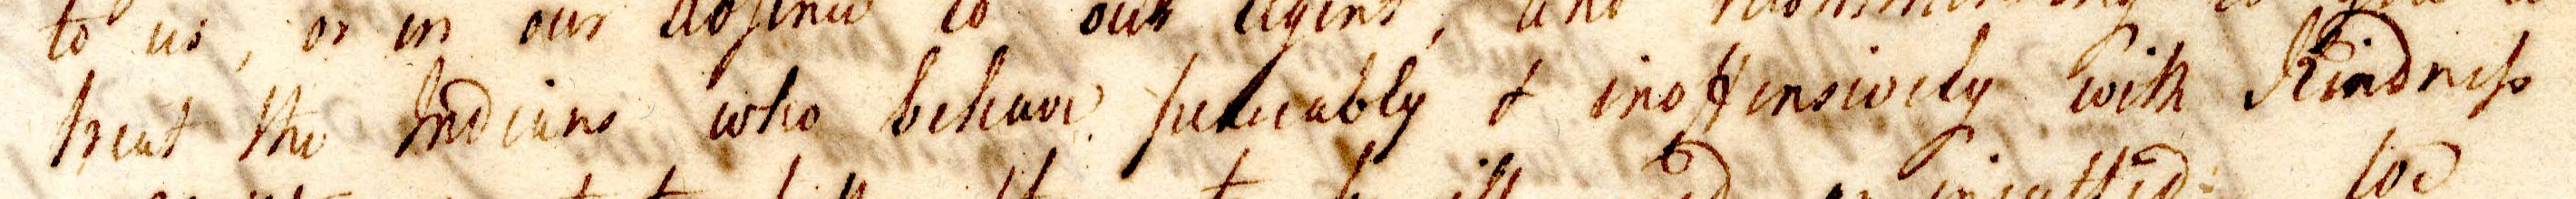treat the Indians who behave peaceably & inoffensively with Kindness
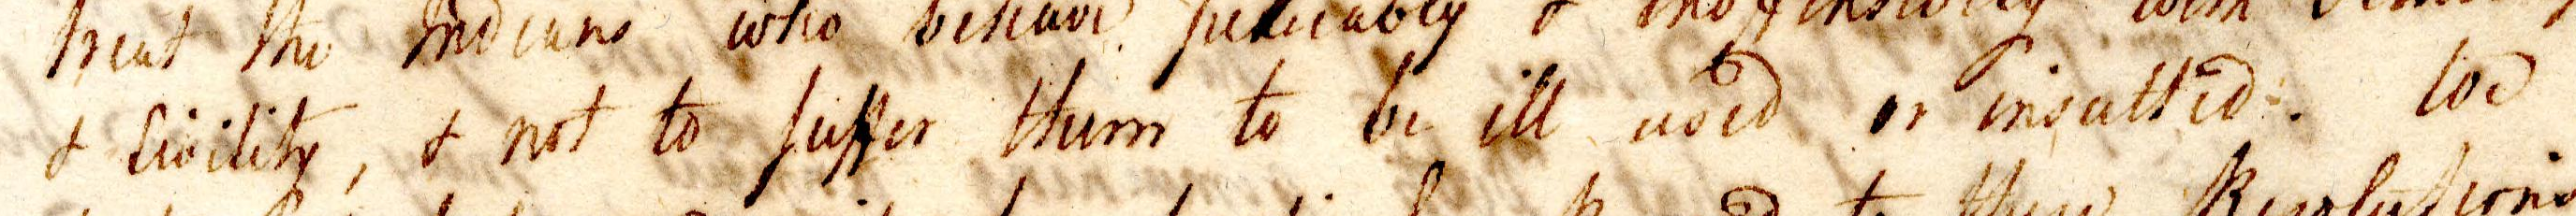& Civility, & not to suffer them to be ill used or insulted. We
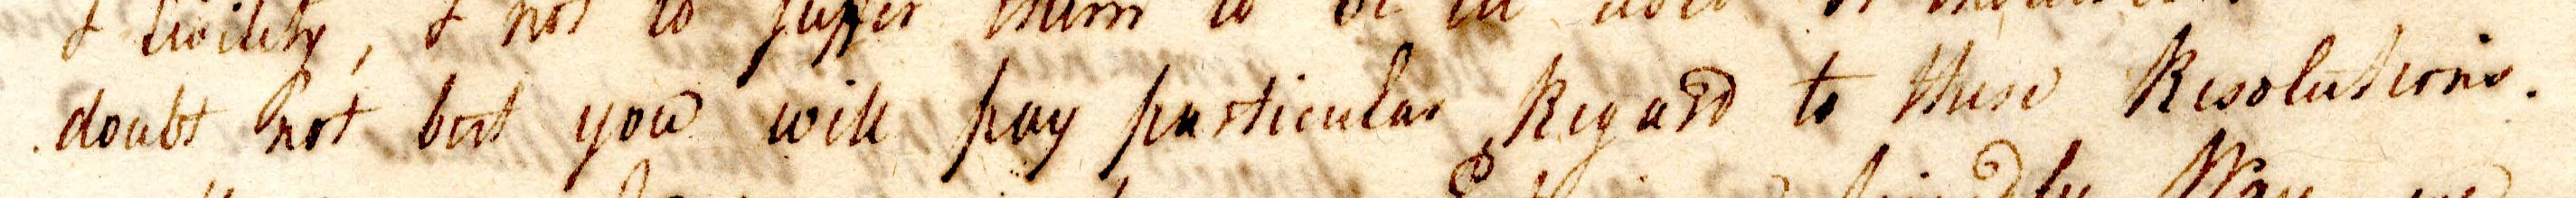doubt not but you will pay particular Regard to these Resolutions.
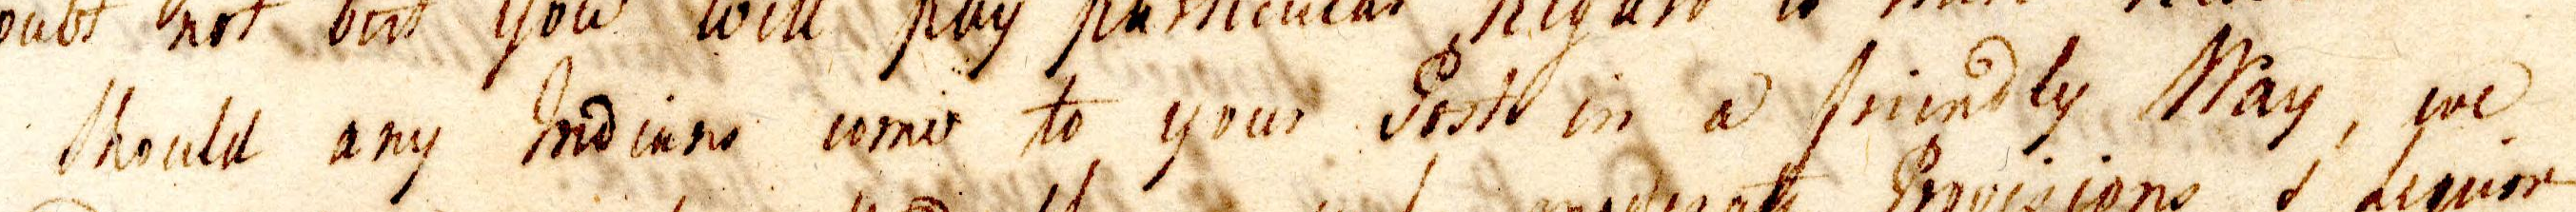Should any Indians come to your Post in a friendly Way, we
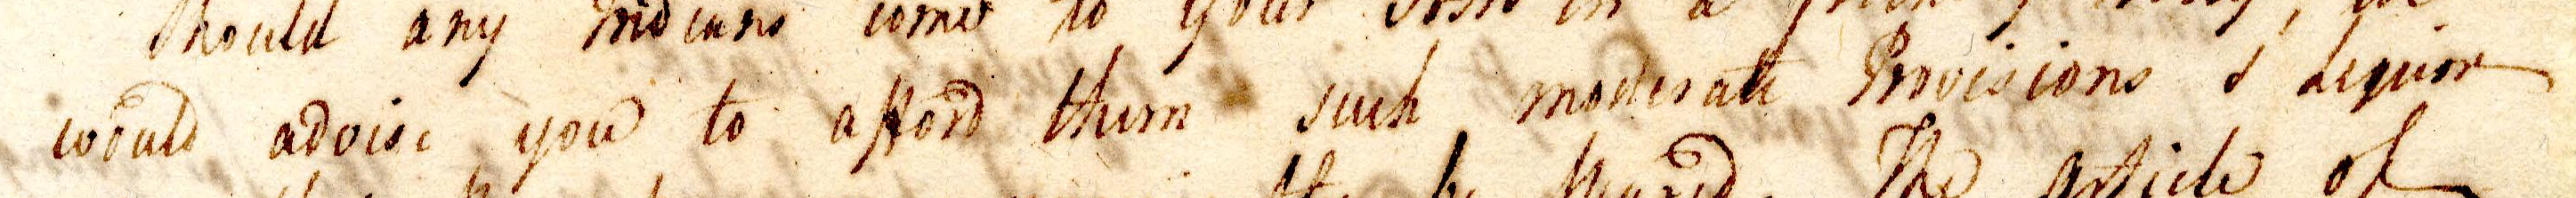would advise you to afford them such moderate Provisions & Liquor
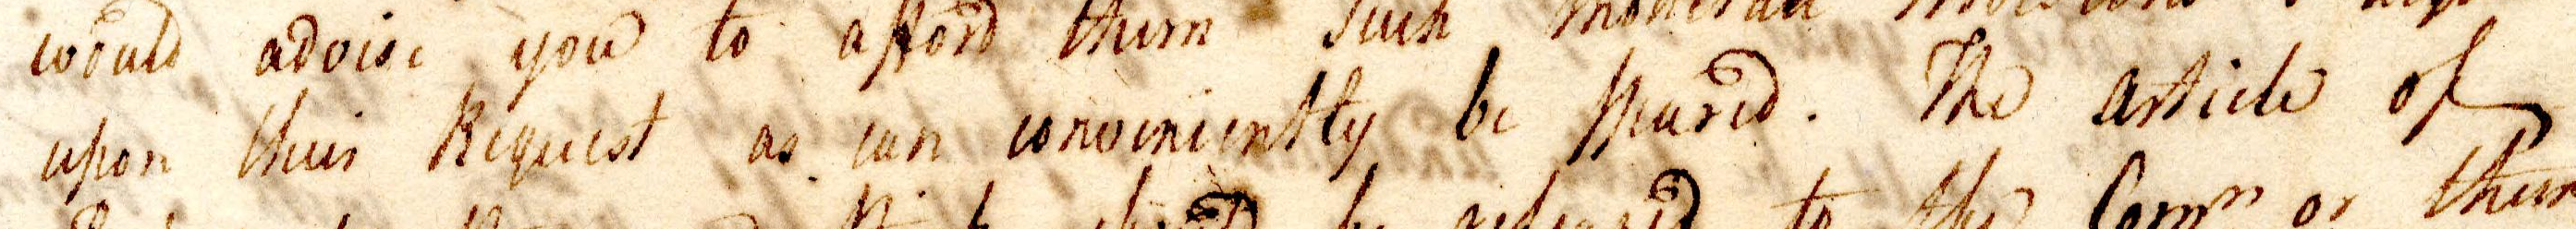upon their Request as can conveniently be spared. The article of
